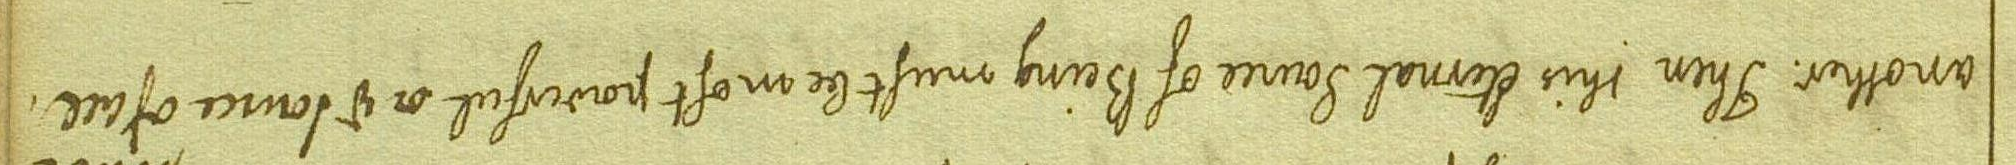another. Then this Eternal Source of Being must be most powerful or y^e Source of all
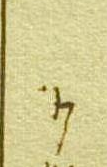4.^th
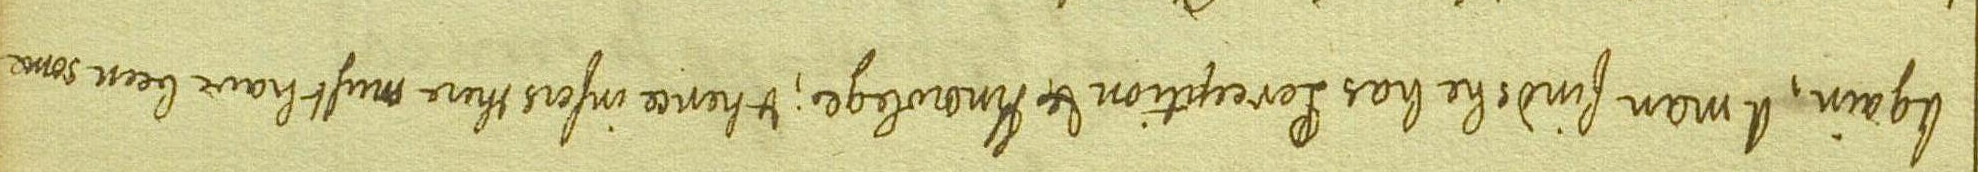Again, a man finds he has Perception & Knowlege; & hence infers there must have been some
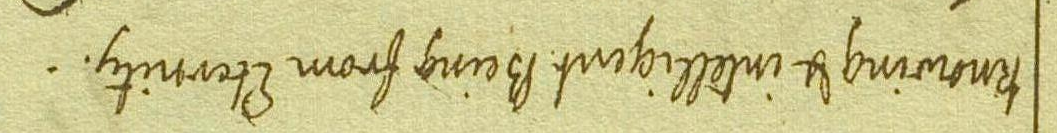knowing & intelligent Being from Eternity..
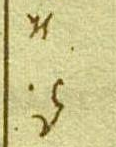5.^th
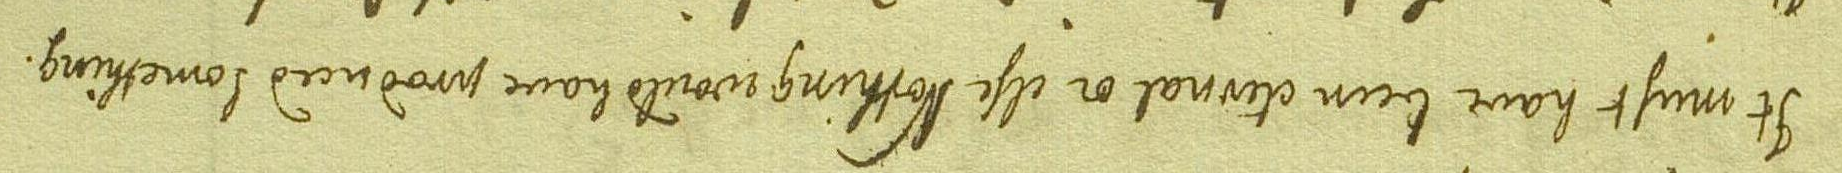It must have been eternal or else Nothing would have produced Something.
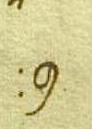6^th:
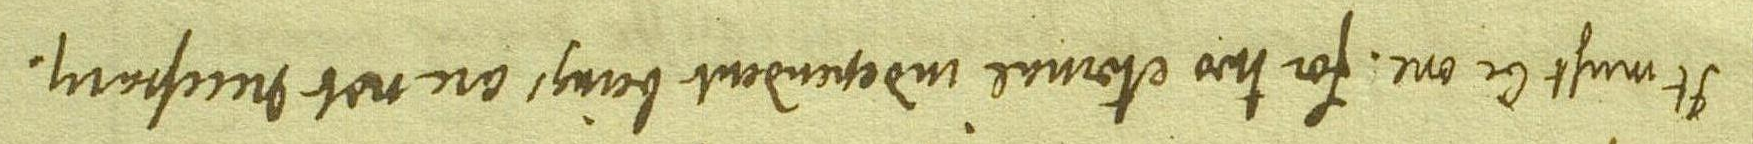It must be one for two eternal independent beings are not necessary.
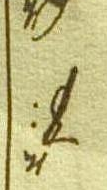7^th:
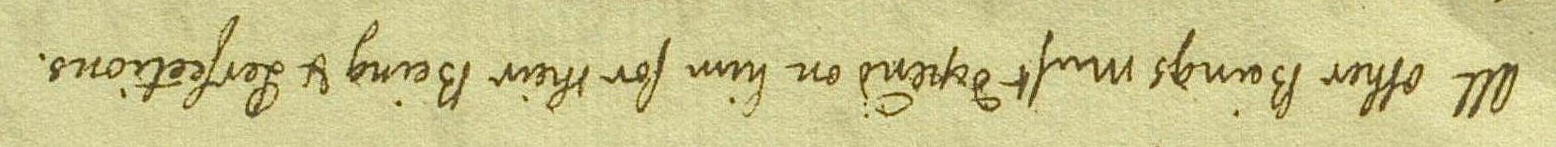All other Beings must depend on him for their Being & Perfections.
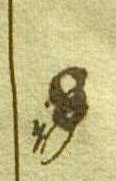8.^th
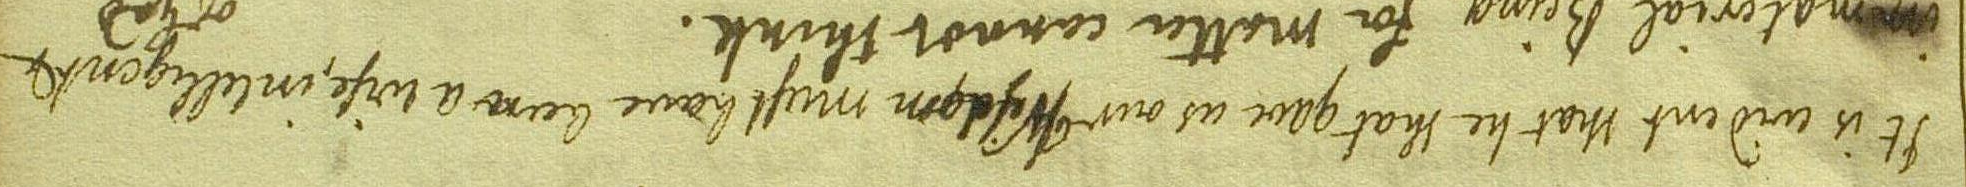It is evident that he that gave us our Wisdom must have been a wise, intelligent &
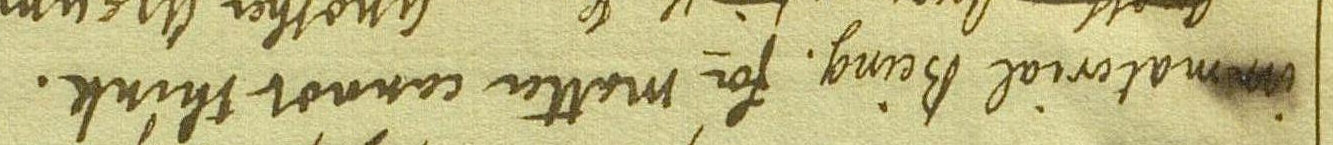immaterial Being. for matter cannot think.
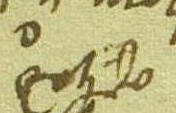of God
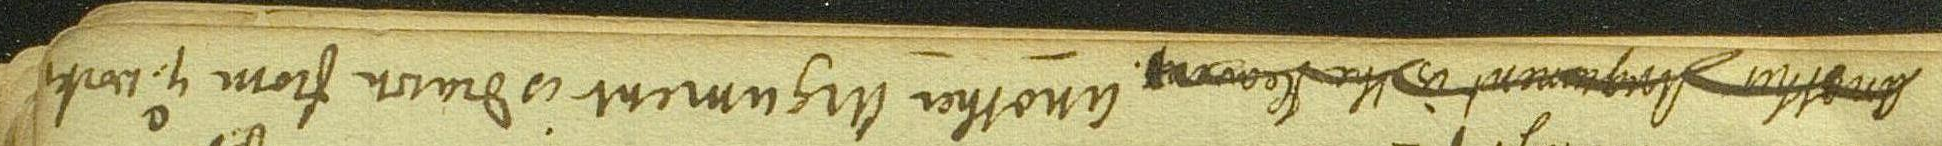[Another Argument is the Heavens] Another Argument is drawn from y^e works
